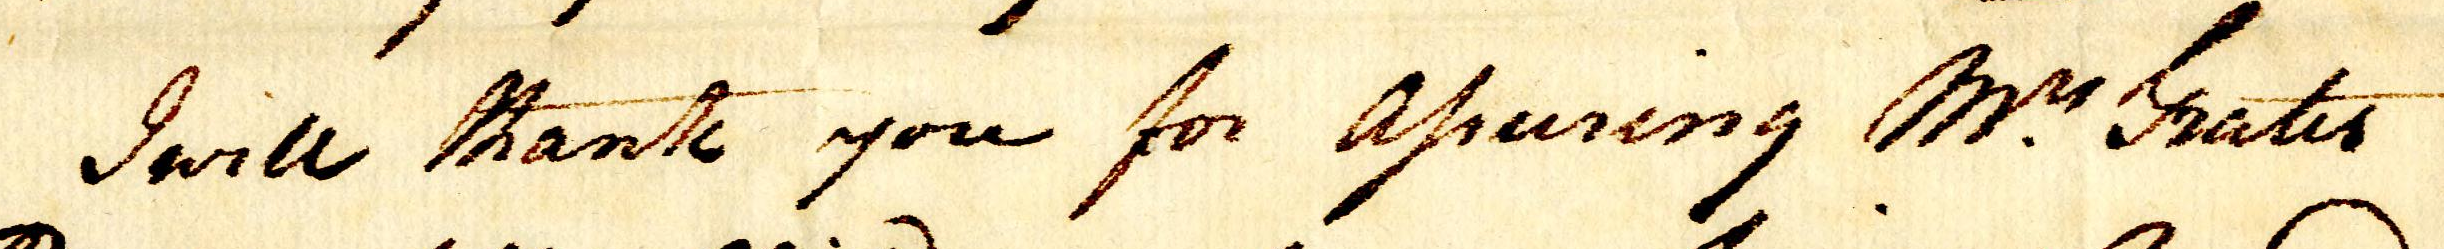I will thank you for Assuring M^rs. Gratz
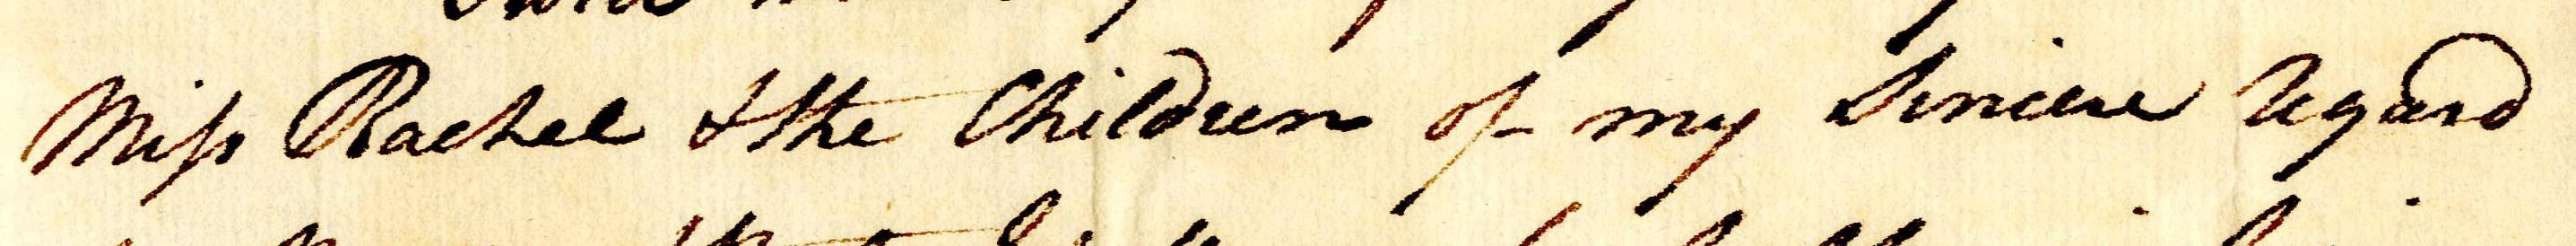Miss Rachel & the Children of my sincere regard
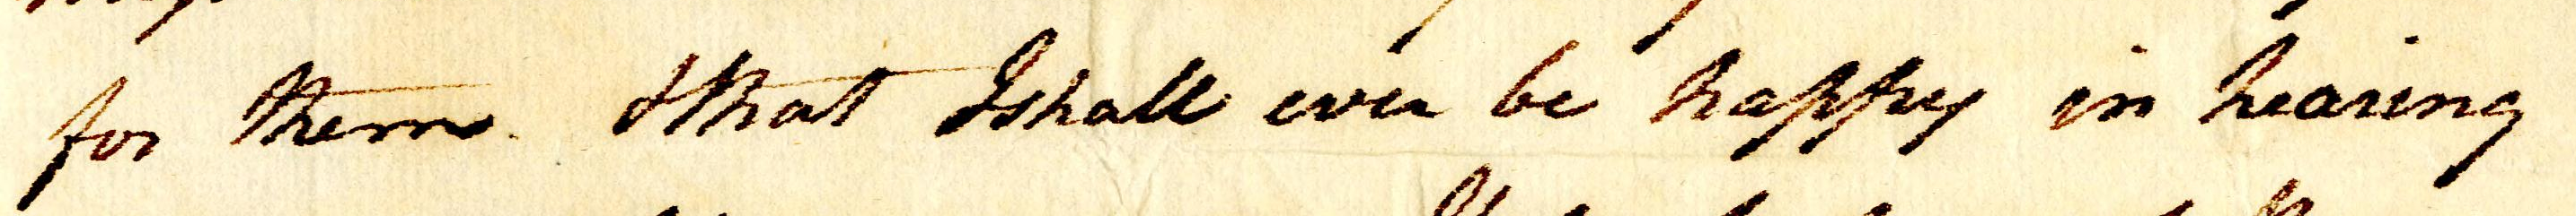for them. & that I shall ever be happy in hearing
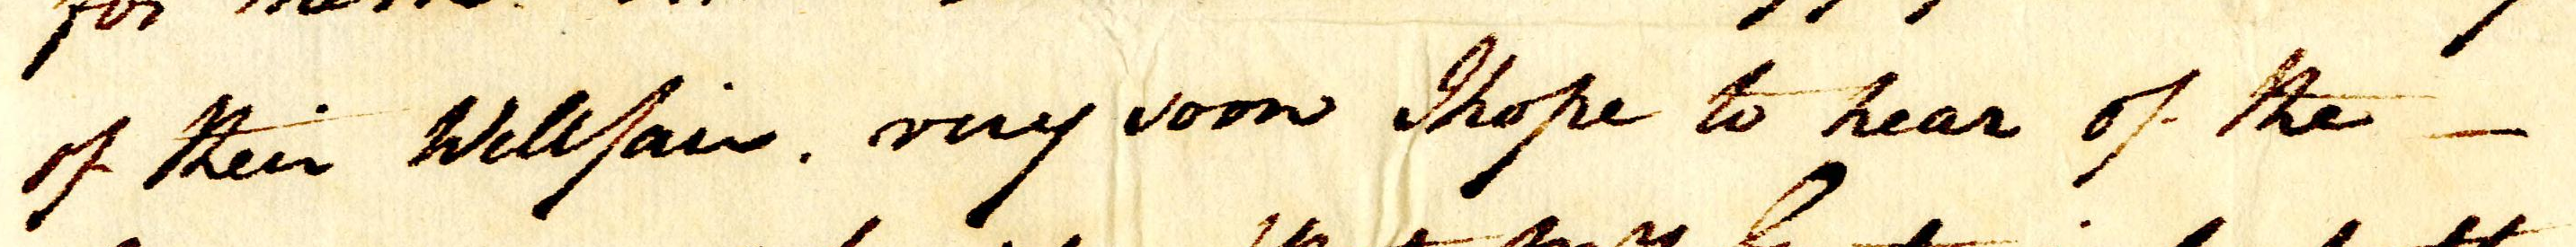of their welfare. very soon I hope to hear of the
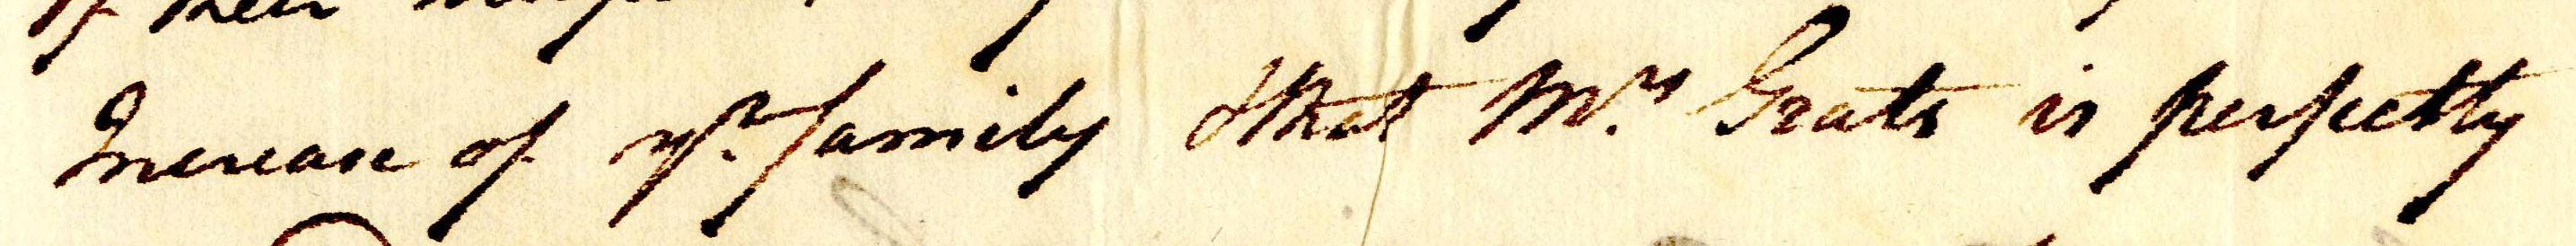Increase of y^r. family that M^rs Gratz is perfectly
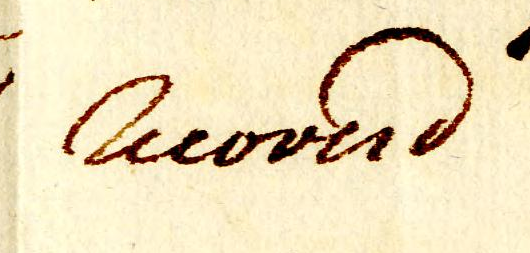recoverd
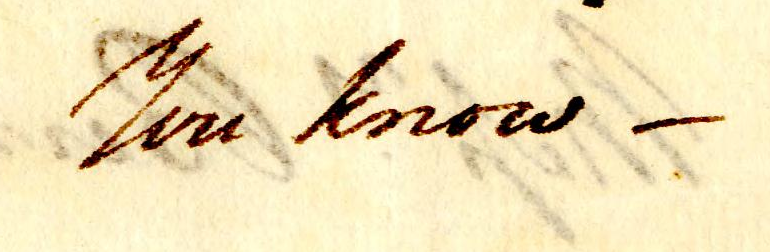You know-
